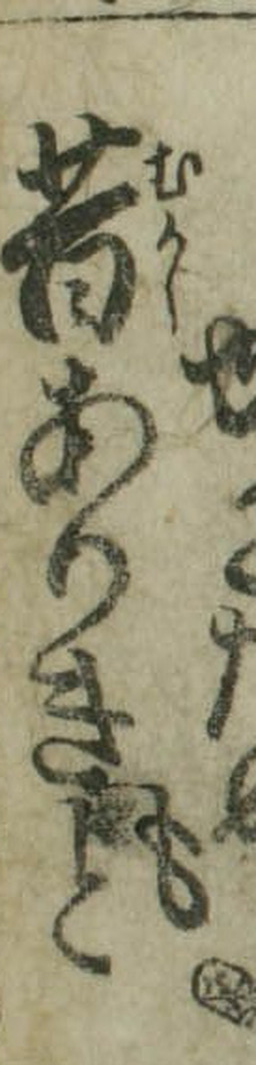昔ありきと

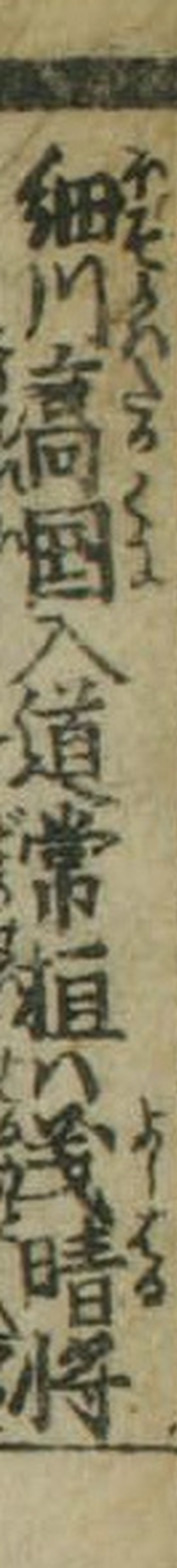細川高国入道常桓は義晴将
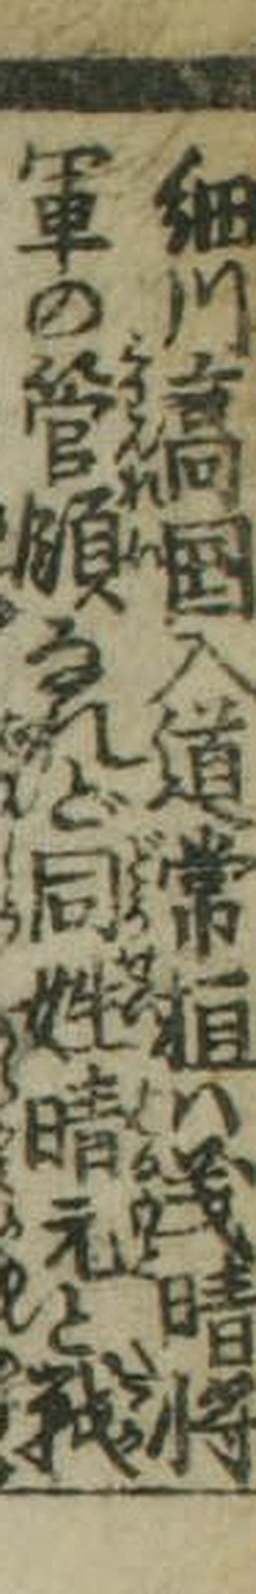軍の管領なれど同姓晴元と戦
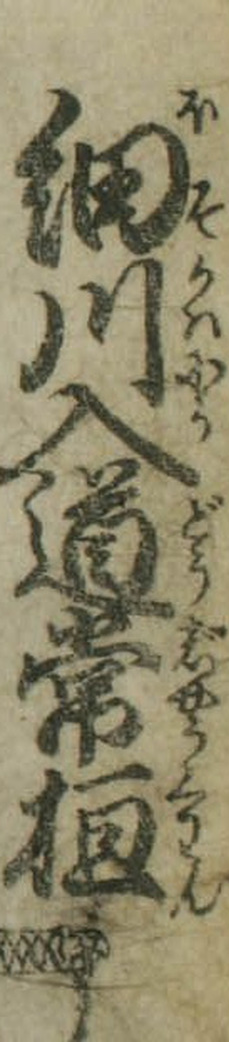細川入道常桓
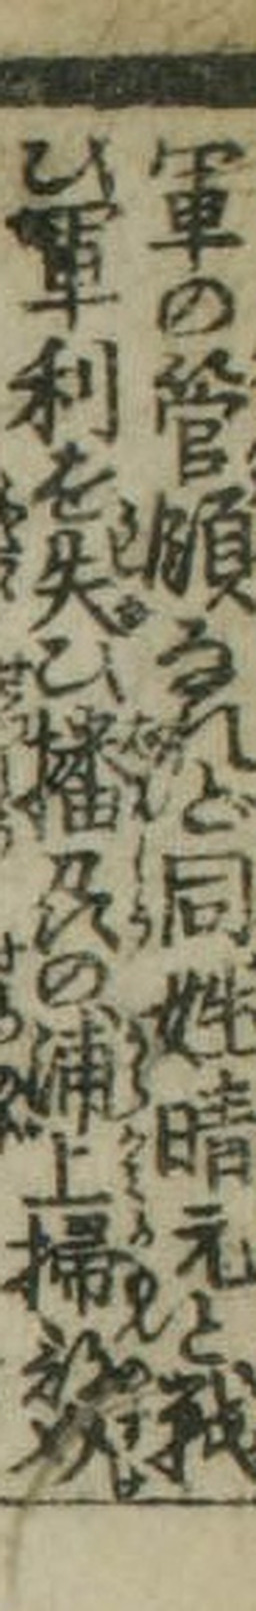ひ軍利を失ひ播州の浦上掃部介
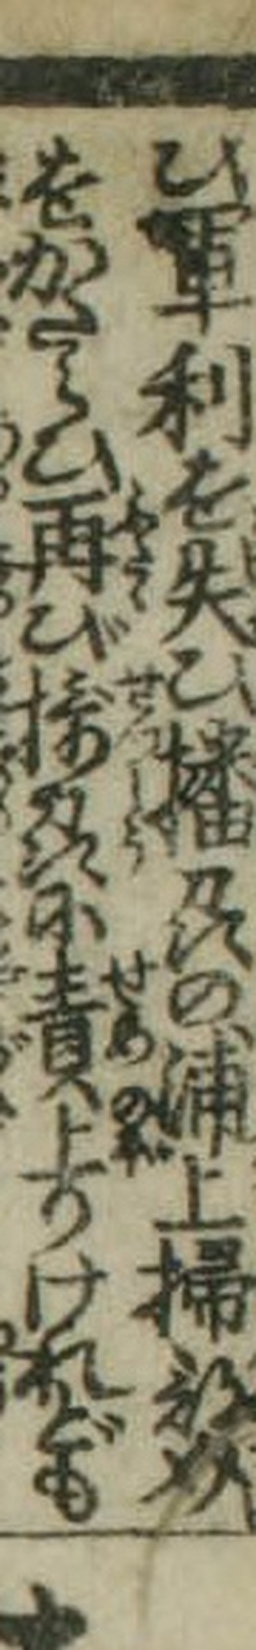をかたらひ再び摂州に責上りけれども
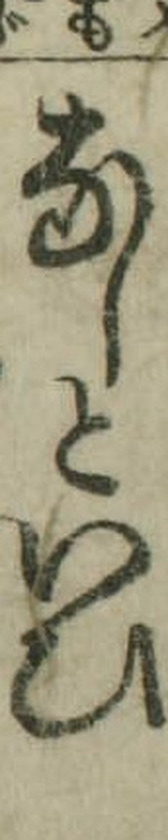なしといひ
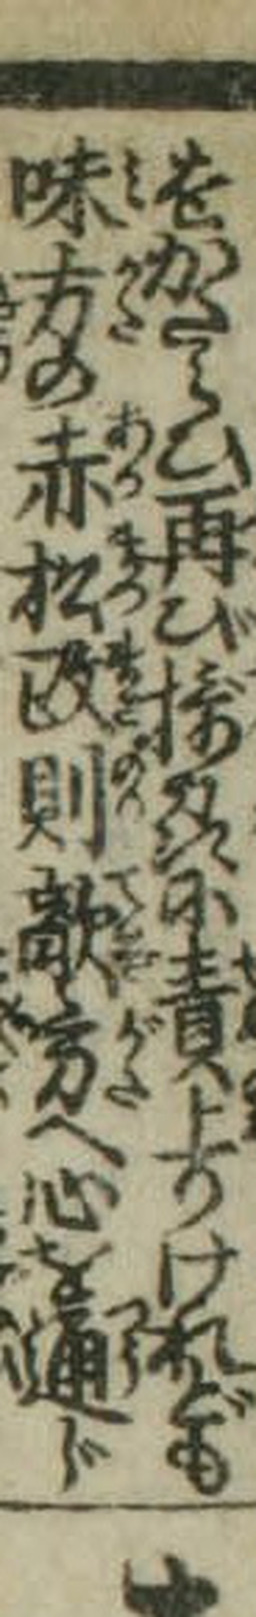味方の赤松正則敵方へ心を通じ
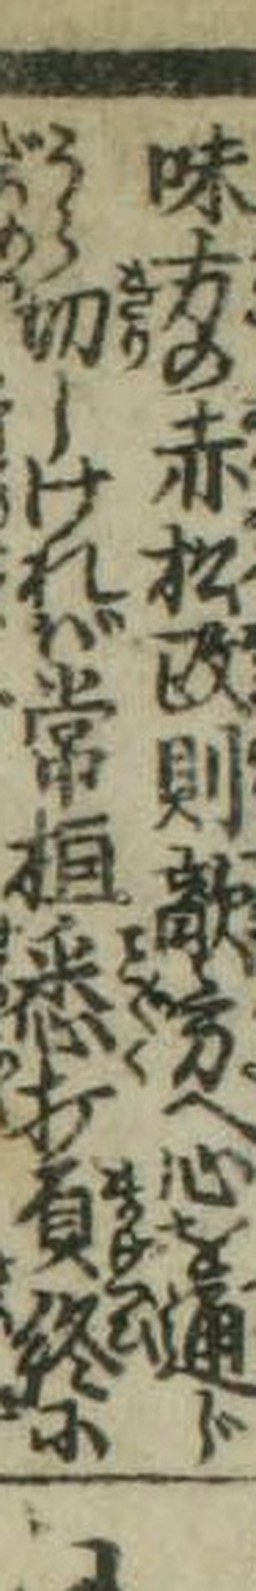うら切しければ常桓悉打負終に
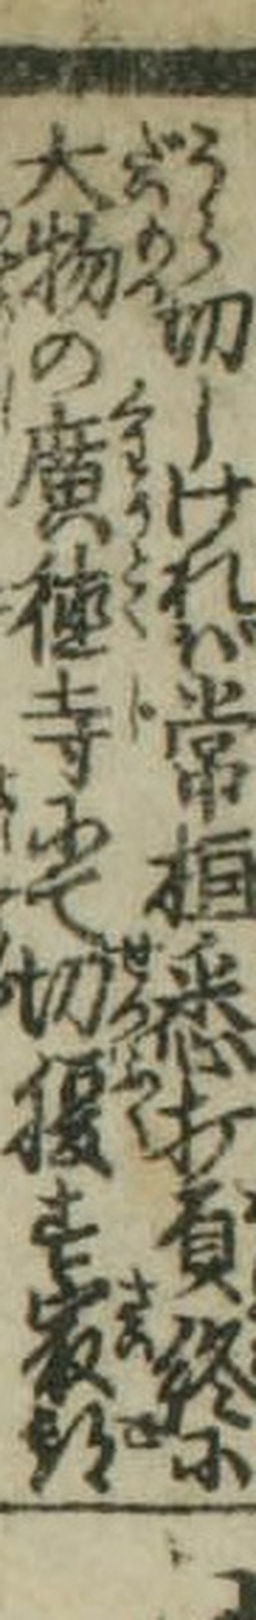大物の広徳寺にて切腹す最期
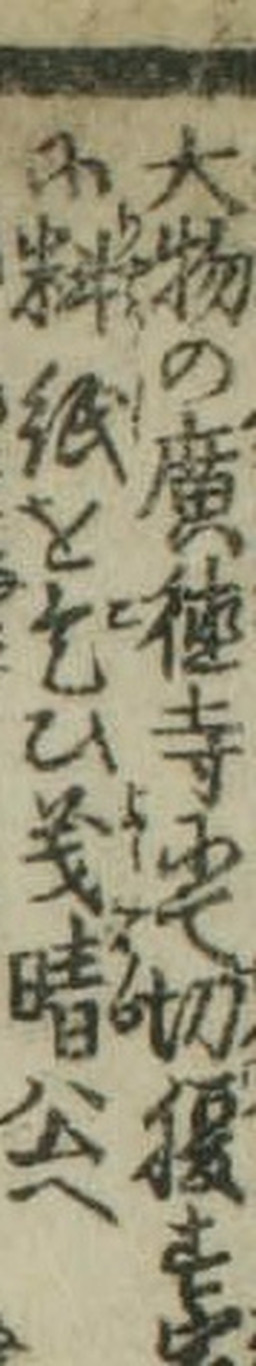に料紙を乞ひ義晴公へ
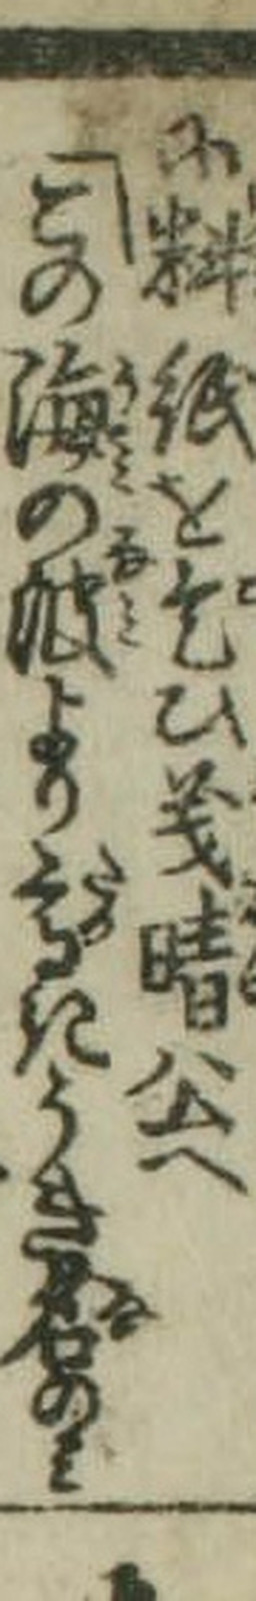〽この海の波より高きうき名のみ
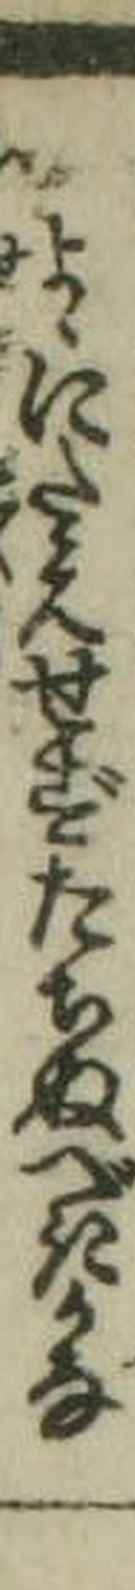よゝにたえせずたちぬべきかな
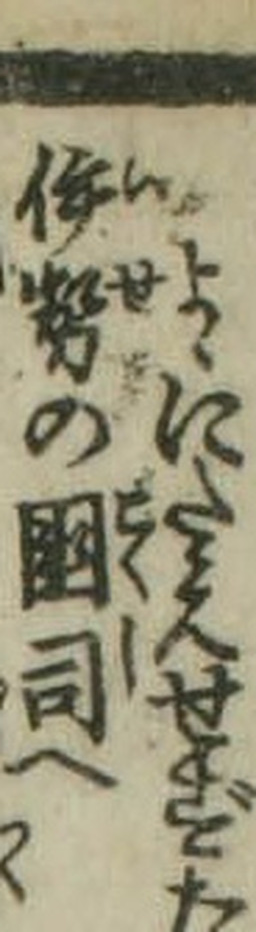伊勢の国司へ
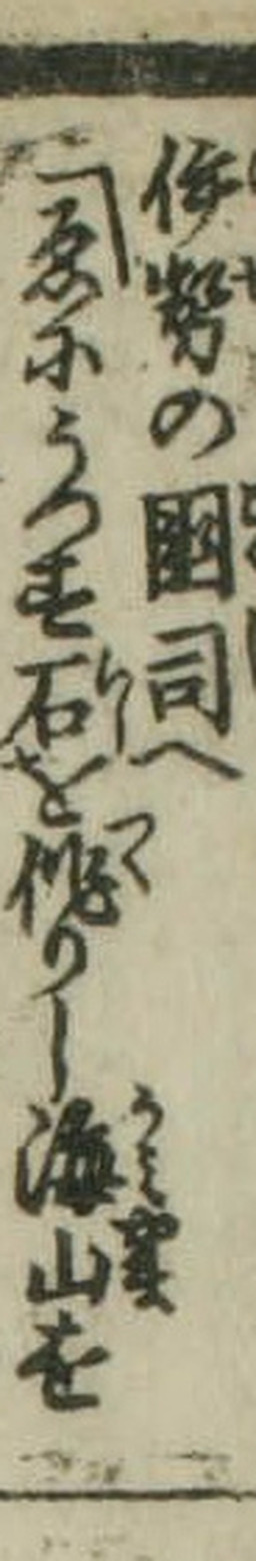〽ゑにうつす石を作りし海山を
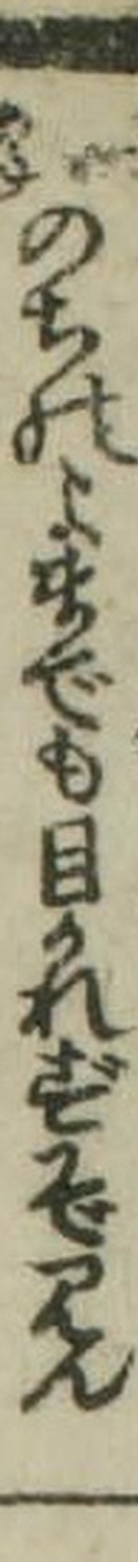のちのよまでも目かれずぞ見ん
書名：續英雄百人一首
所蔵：東京学芸大学附属図書館
